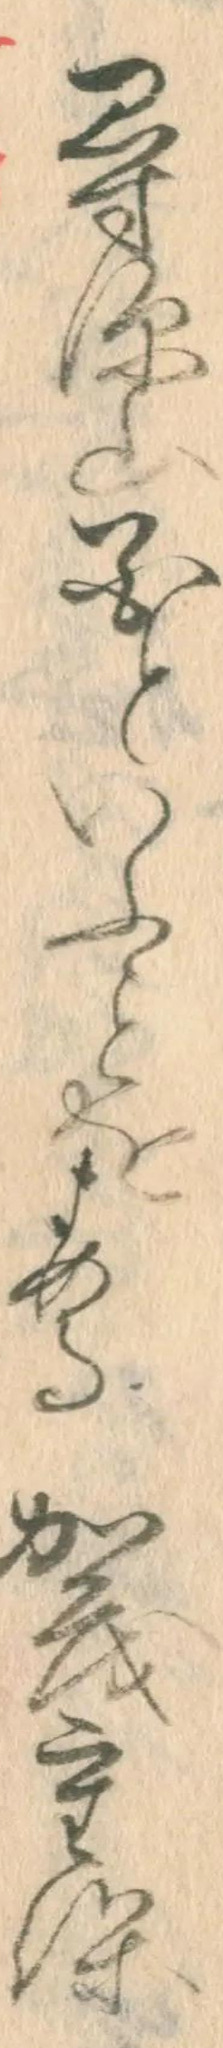尋深山花といふことをよめる賀茂重保
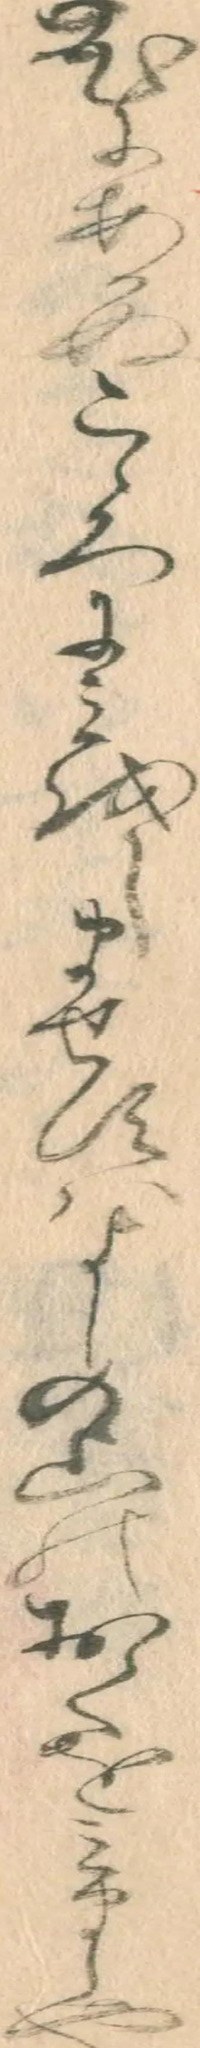花にあかぬこゝろにみをしませすはよしのゝ山のおくをみましや
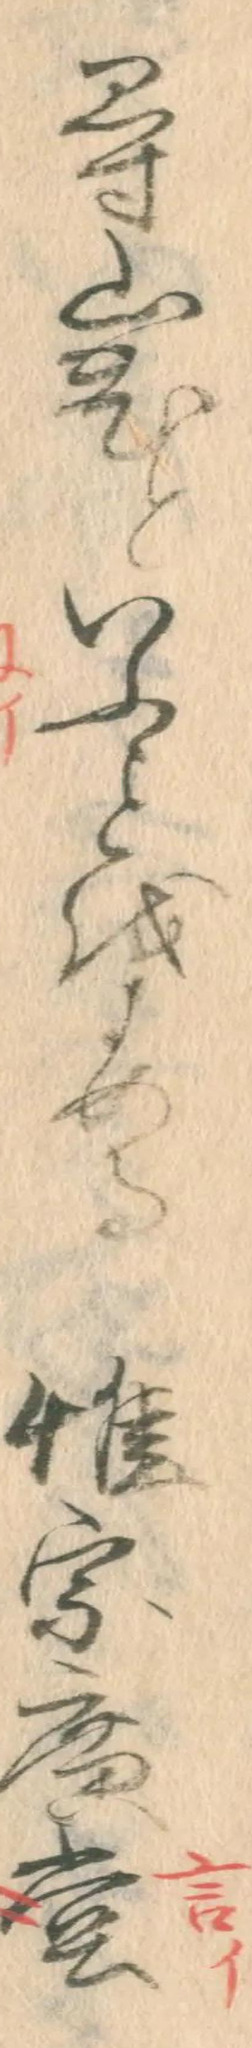尋深山花といふことをよめる賀茂重保
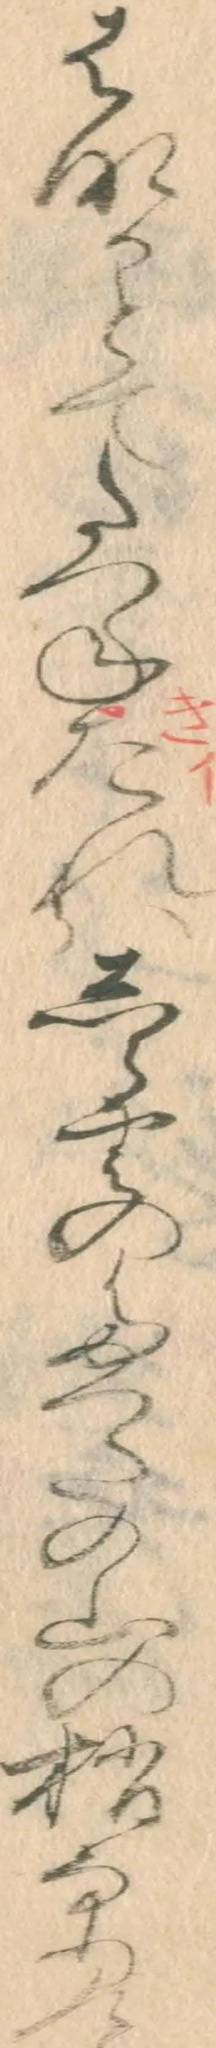はなかとてたつね◦たれはしら雲のたつたの山の梢なりけり
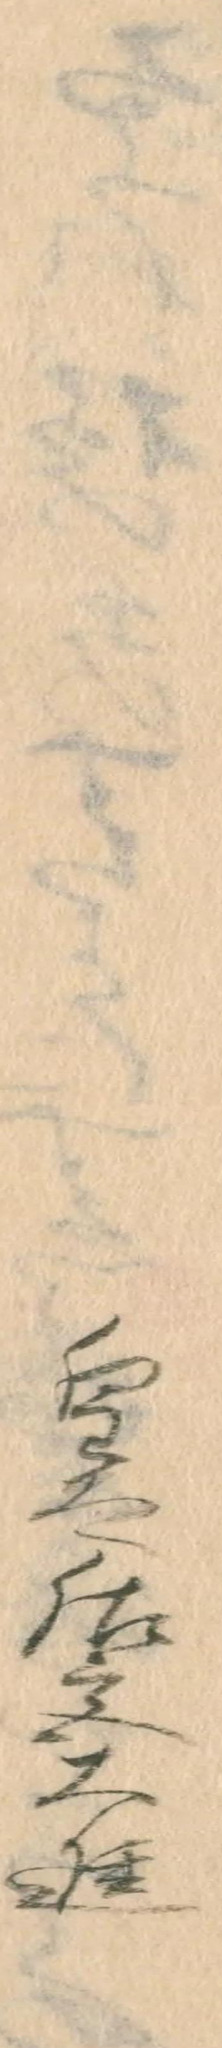皇太后佐宮大進
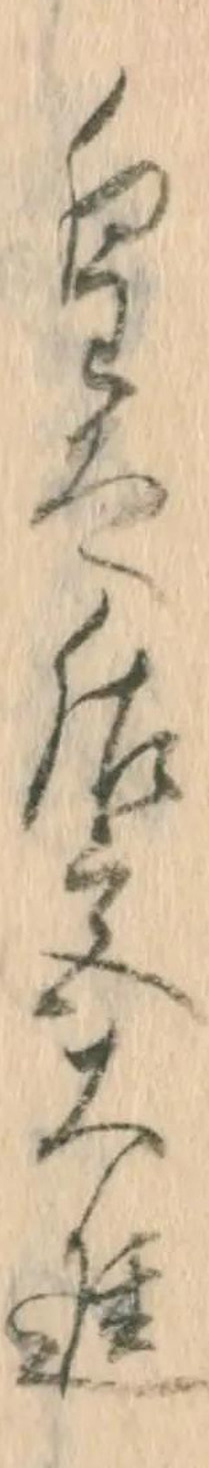皇太后佐宮大進
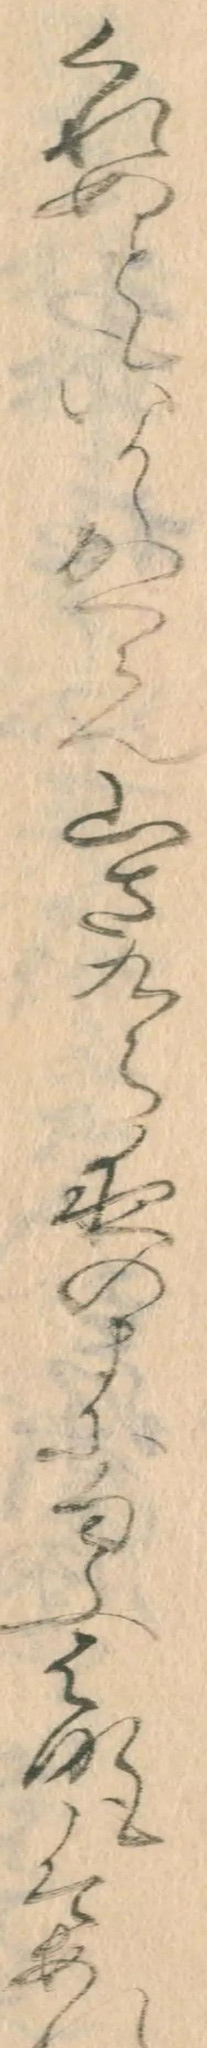くれぬともいかしかへらん山さくら夜のまに匂ふはなもこそあれ
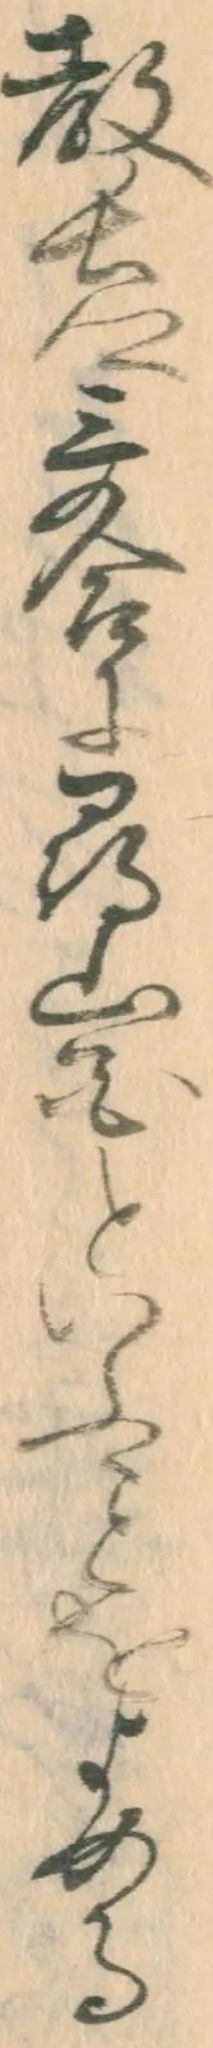教長卿歌合に尋山花といふことをよめる
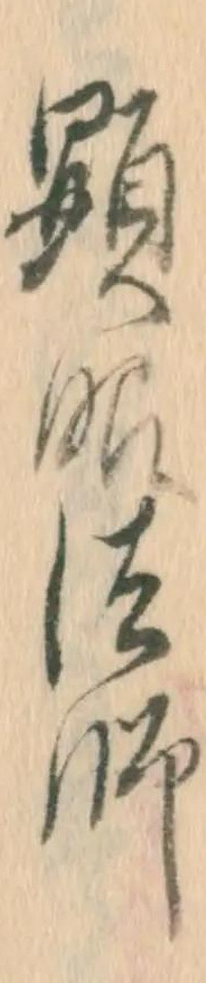顕昭法師
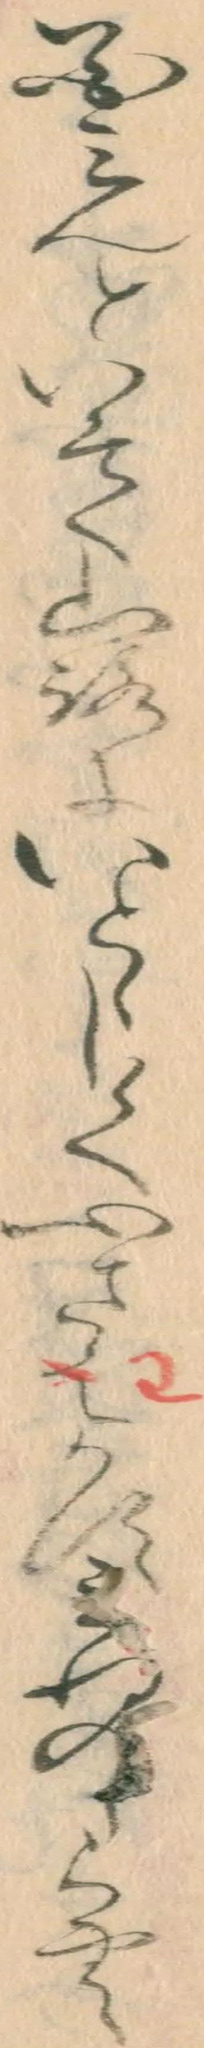花みんといそく山路にいとゝしく心さはわかすみねのしら雲
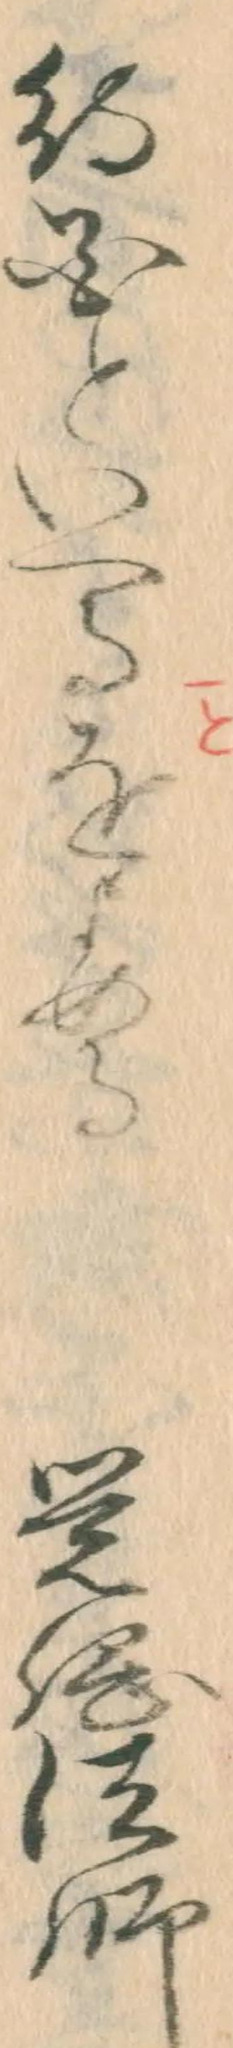待花といへるをよめる覚綱法師
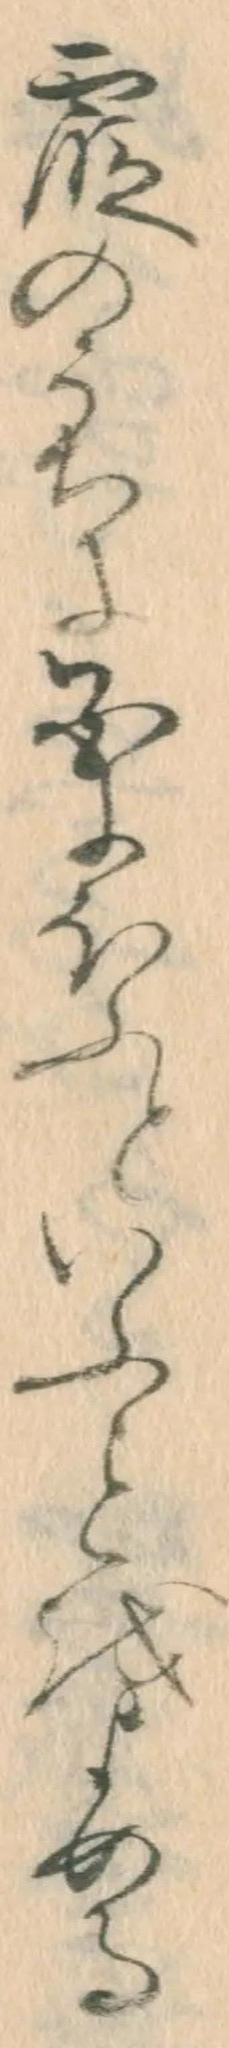霞のうちに花にほふといふことをよめる
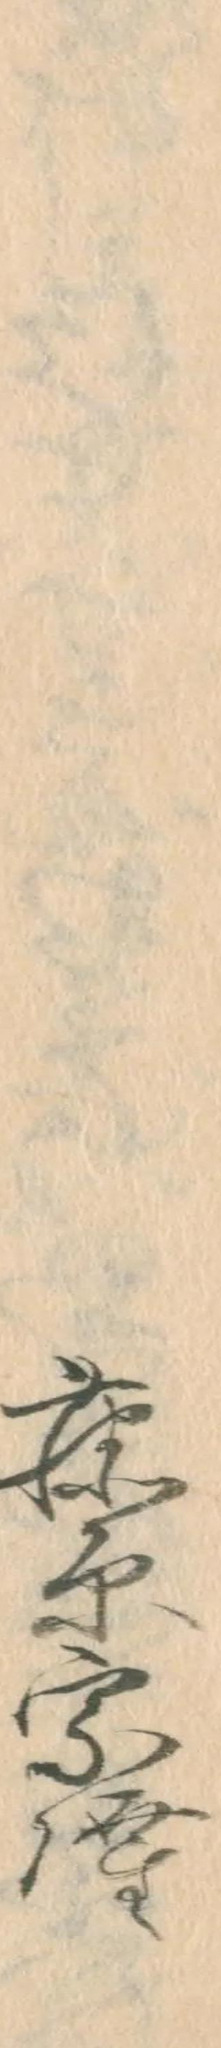藤原宗隆
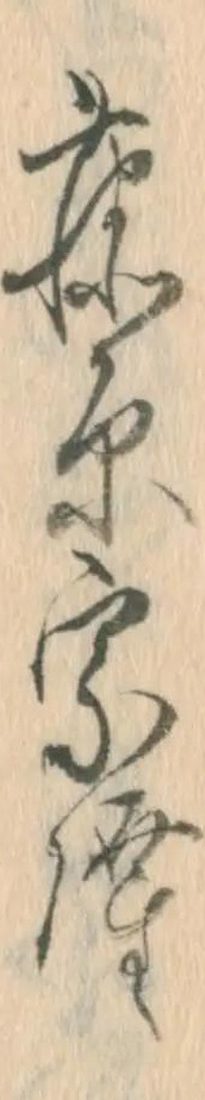藤原宗隆
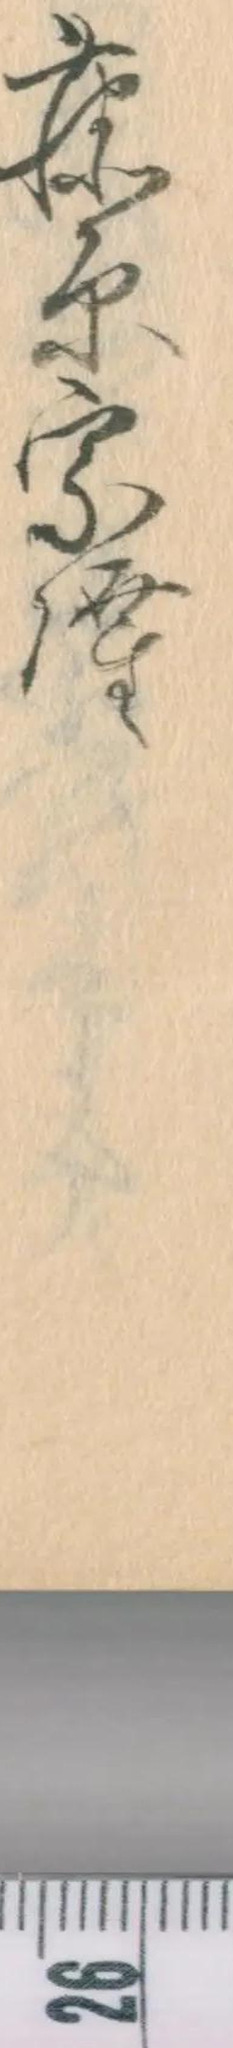藤原宗隆
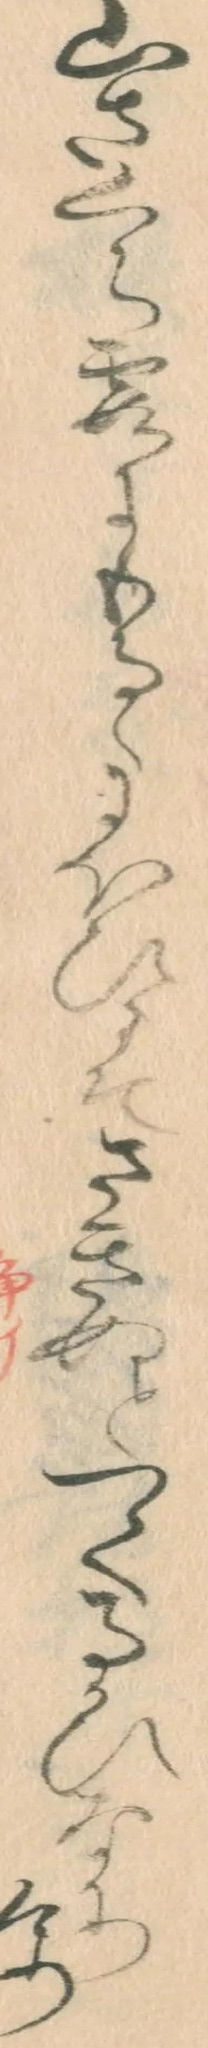山さくら霞にもるゝにほひこそさきぬとつくるかひなかりけり
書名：月詣和歌集
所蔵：国立国会図書館 National Diet Library, JAPAN
